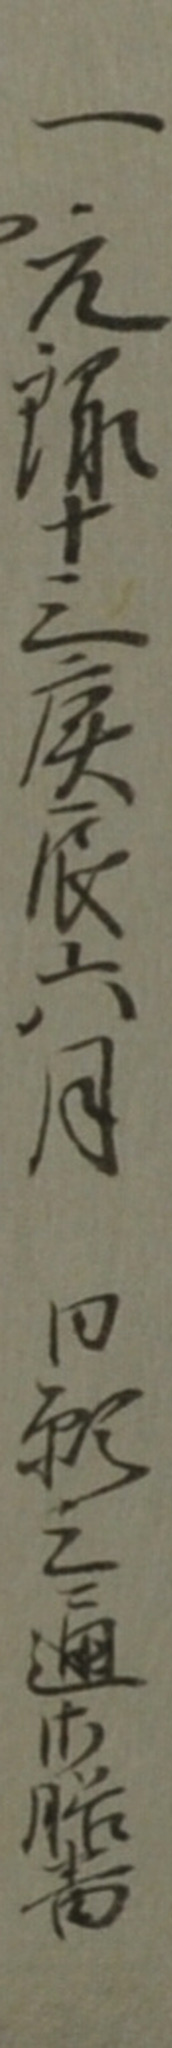一元禄十三庚辰六月日願之通御膳番
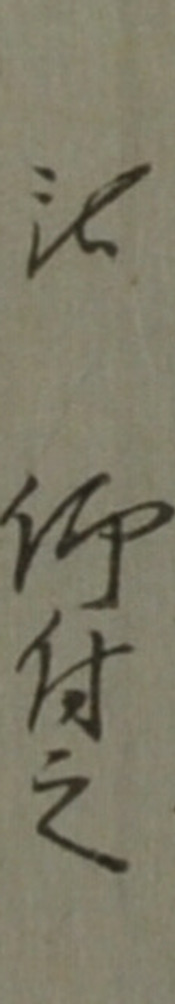被仰付之
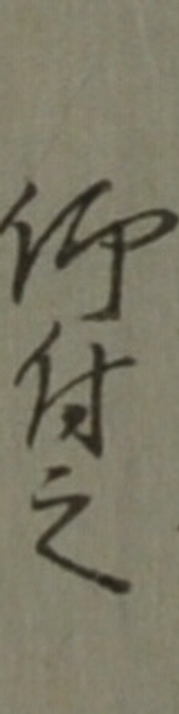被仰付之
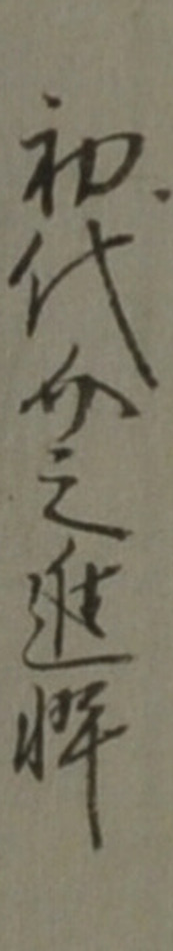初代介之進忰
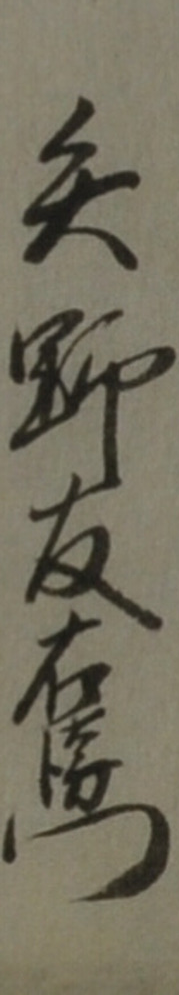矢野友右衛門
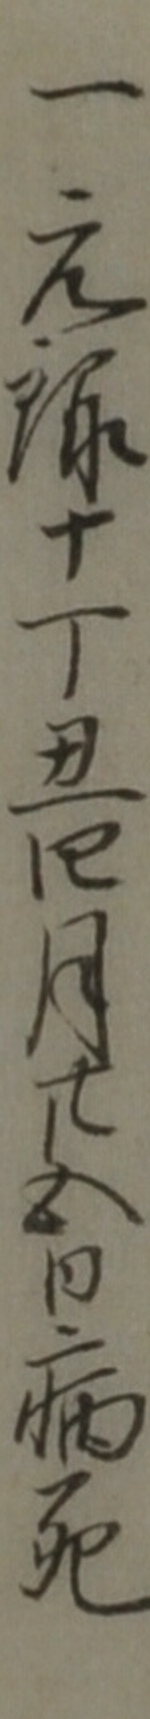一元禄十丁丑四月廿五日病死
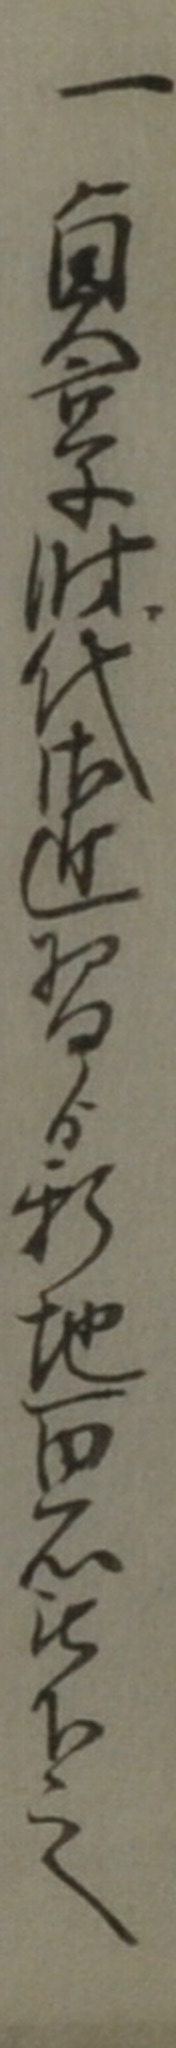一貞享時代御近習ゟ新地百石被下之
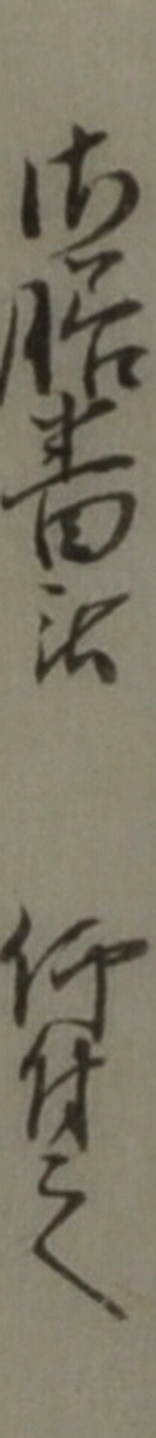御膳番被仰付之
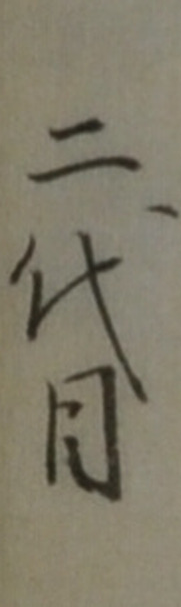二代目
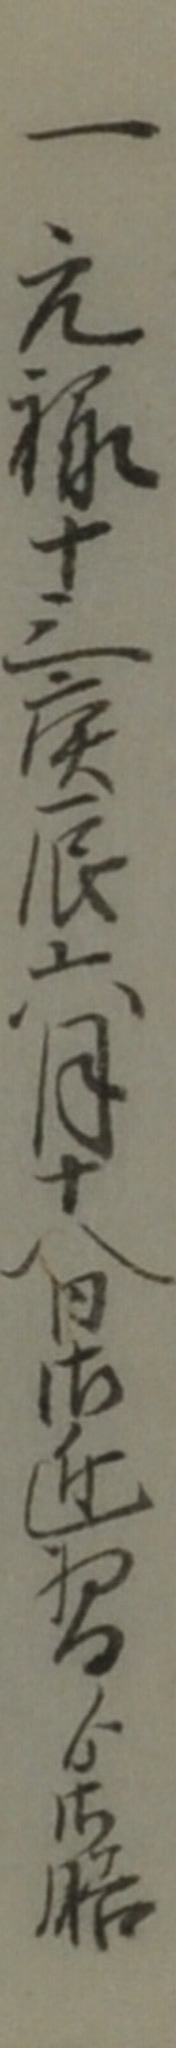一元禄十三庚辰六月十八日御近習ゟ御膳
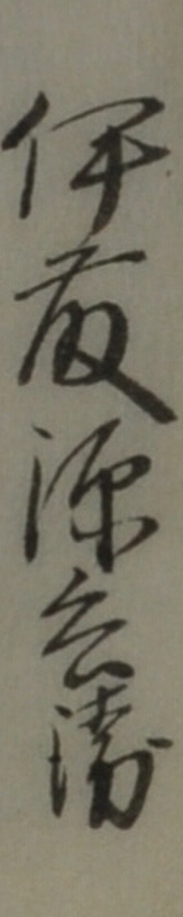伊藤源兵衛
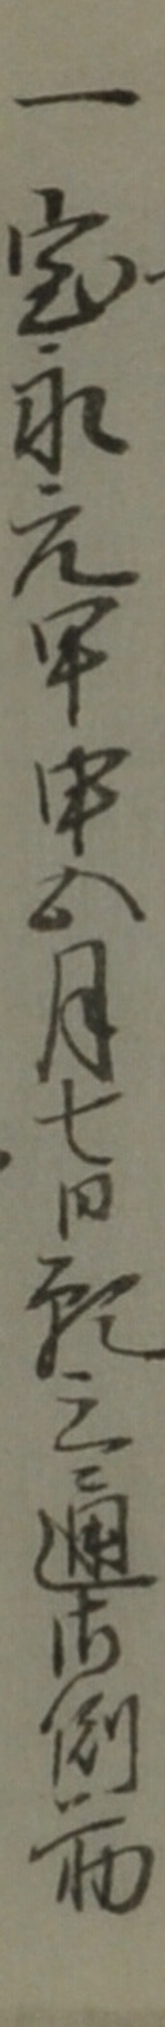一宝永元甲申五月七日願之通御側勤
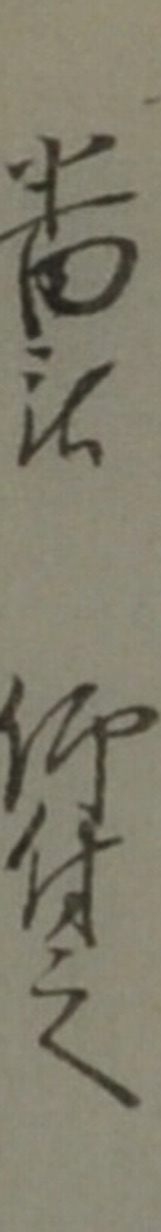番被仰付之
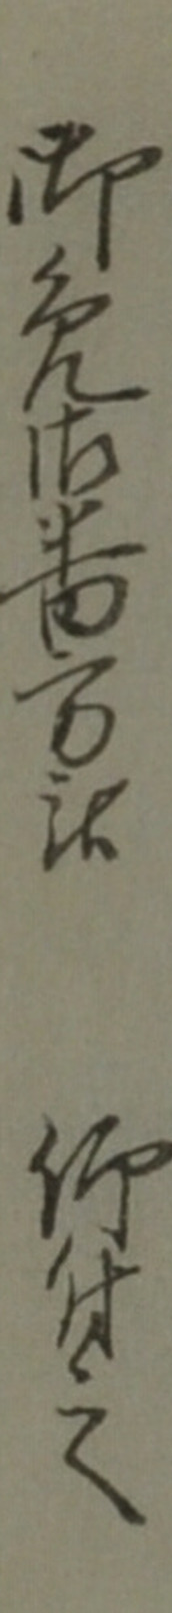御免御番方被仰付之
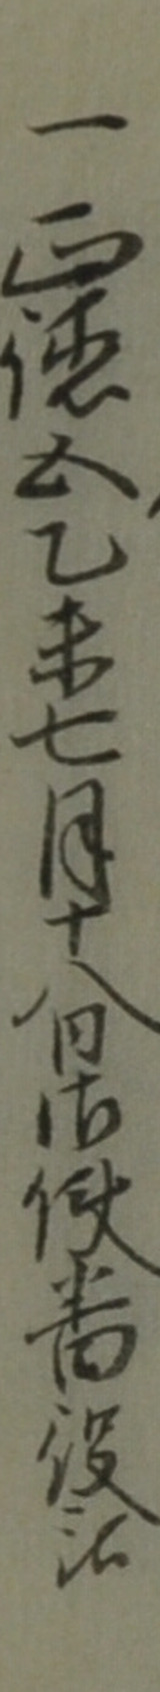一正徳五乙未七月十八日御使番役被
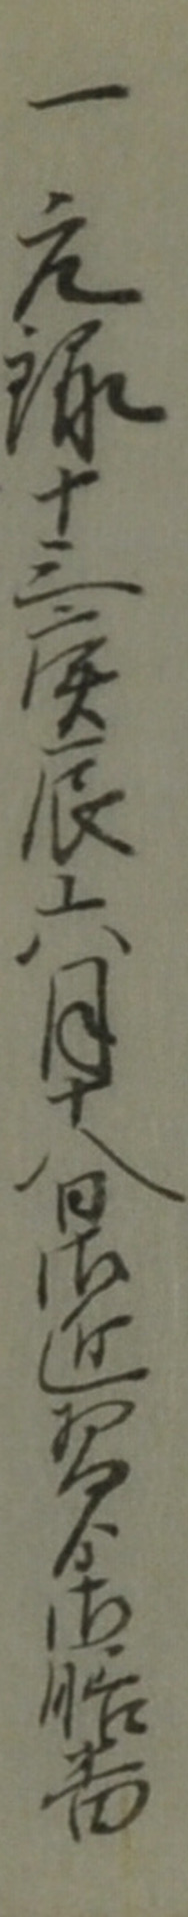一元禄十三庚辰六月十八日御近習ゟ御膳番
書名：諸御役代々録（四）
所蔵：伊那市立高遠町図書館・合同会社AMANE
